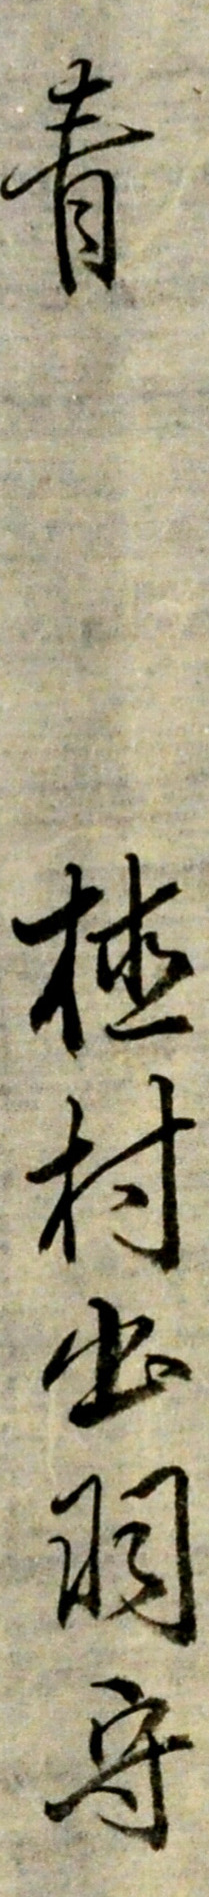青植村出羽守
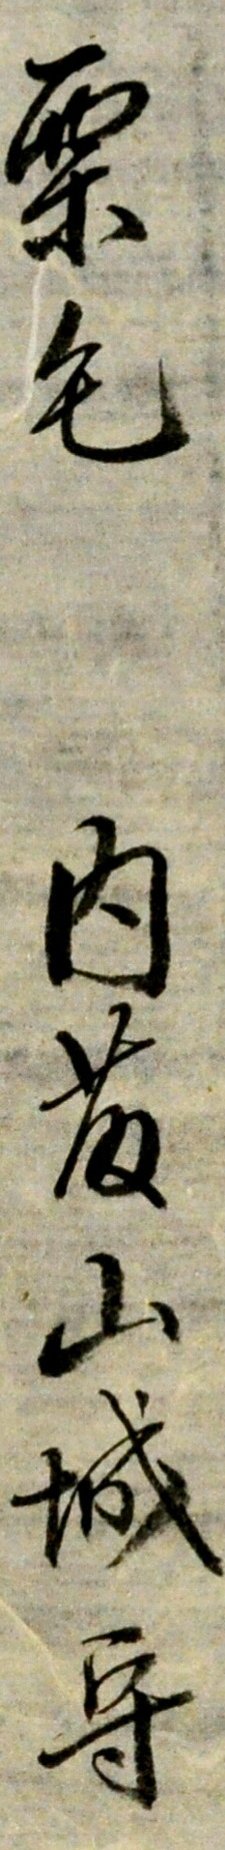栗毛内藤山城守
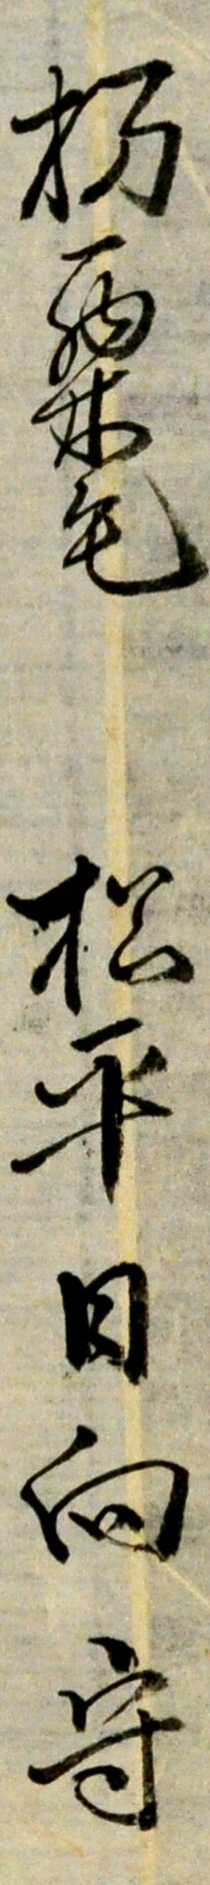栃栗毛松平日向守
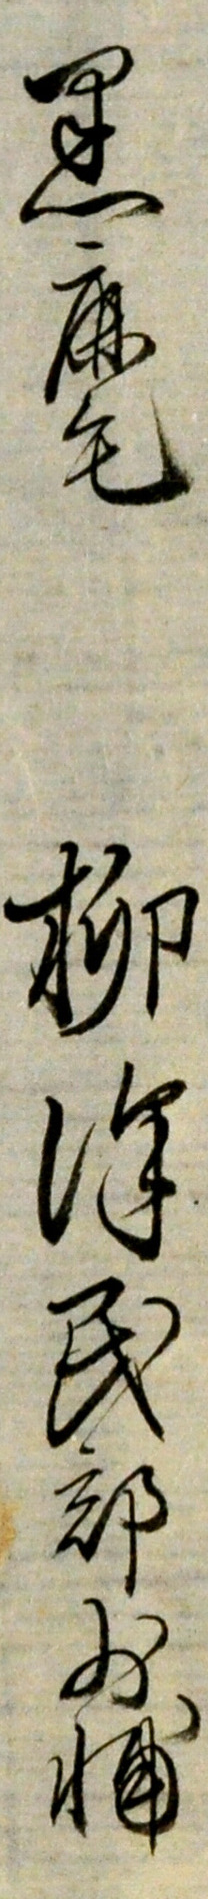黒鹿毛柳沢民部少輔
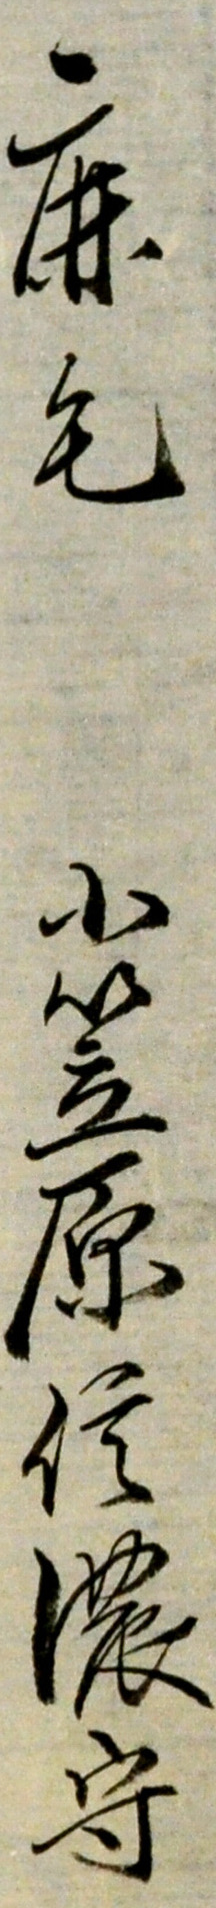鹿毛小笠原信濃守
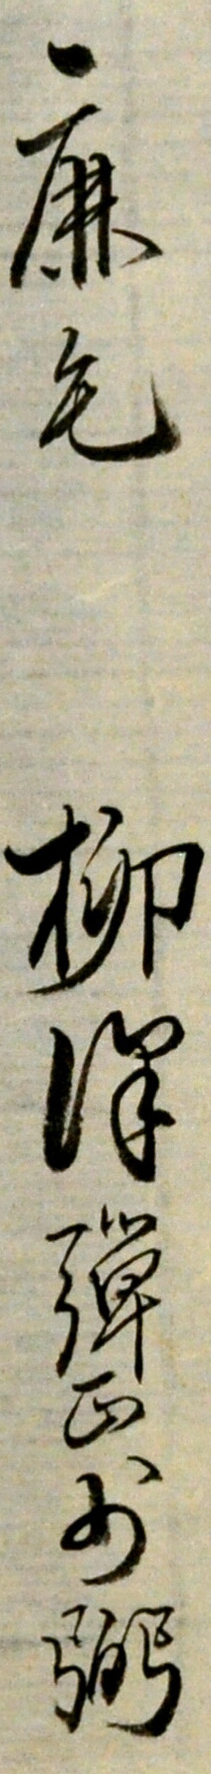鹿毛柳沢弾正少弼

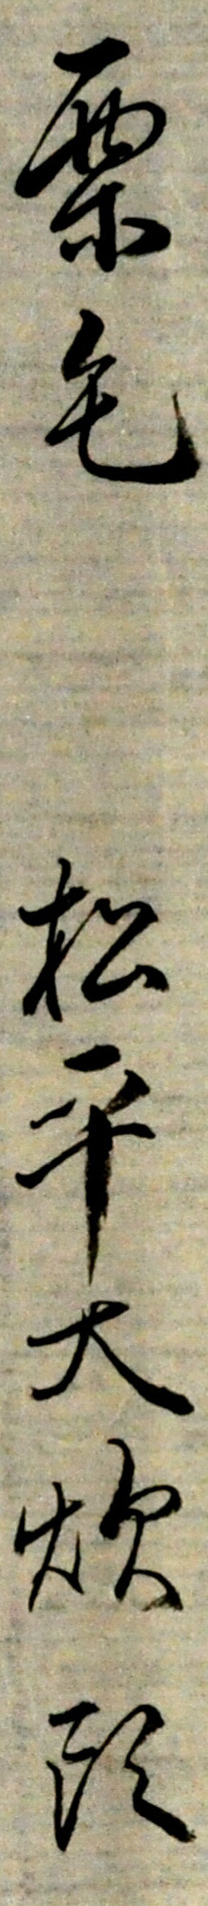栗毛松平大炊頭
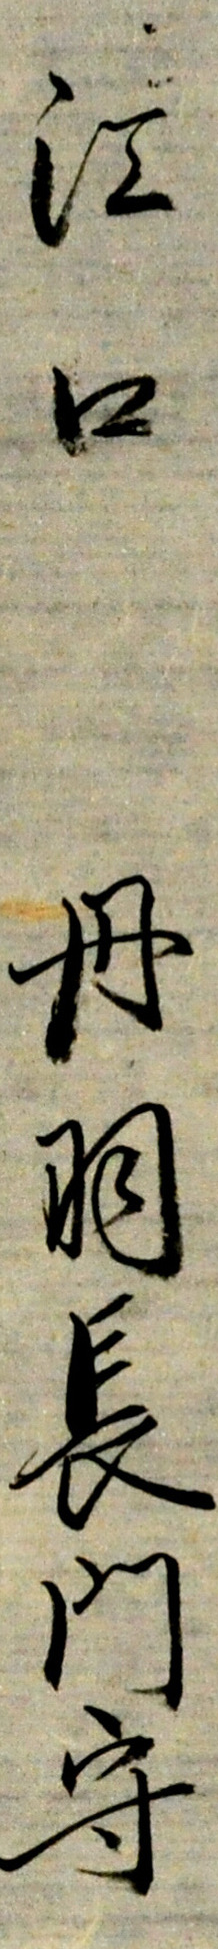江口丹羽長門守
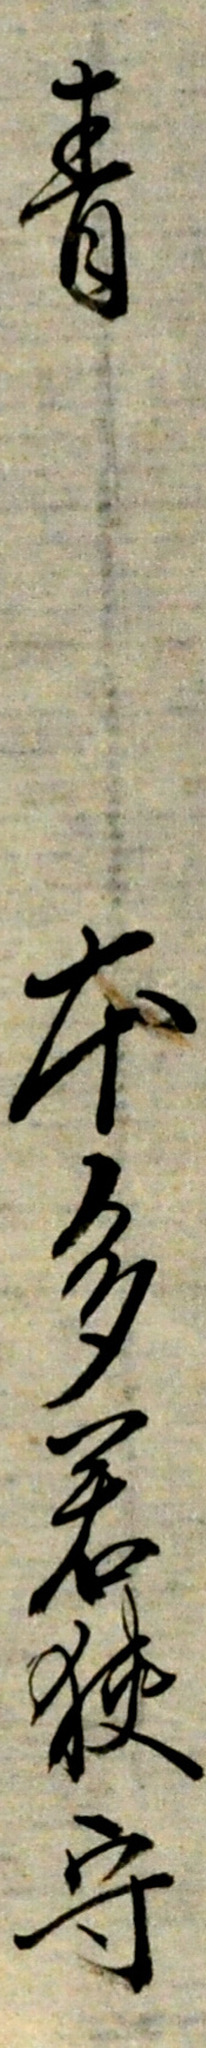青本多若狭守
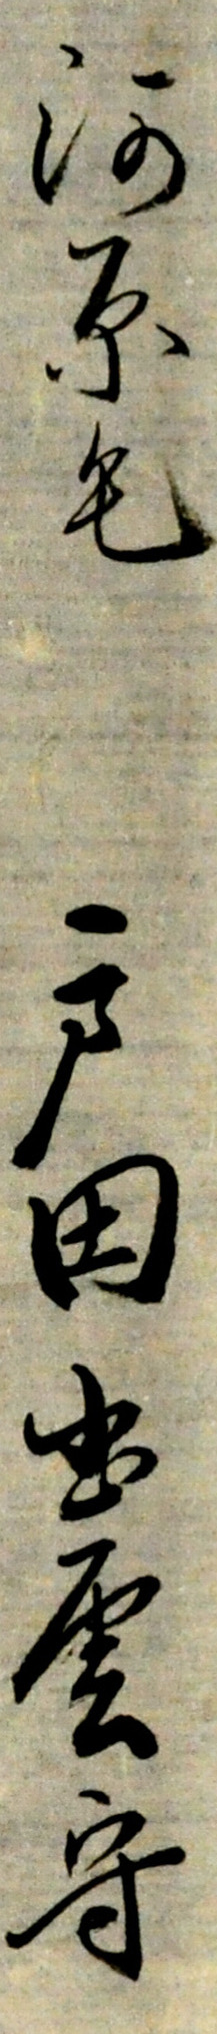河原毛戸田出雲守
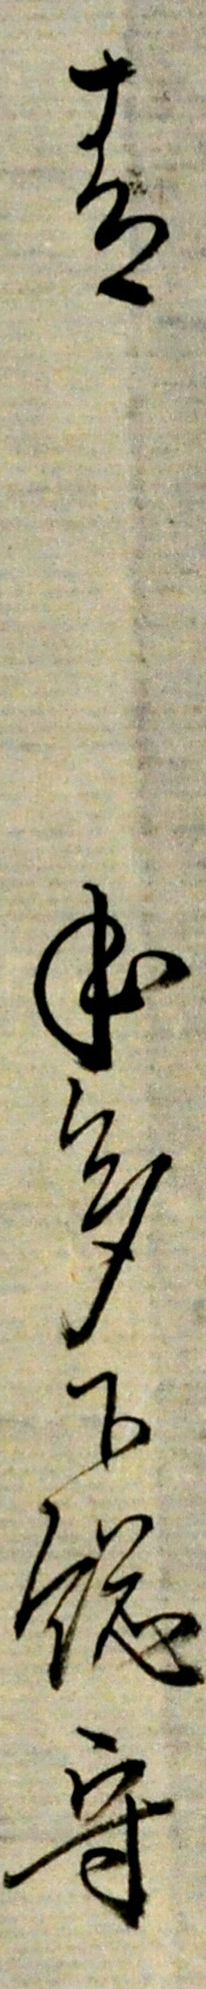青本多下総守
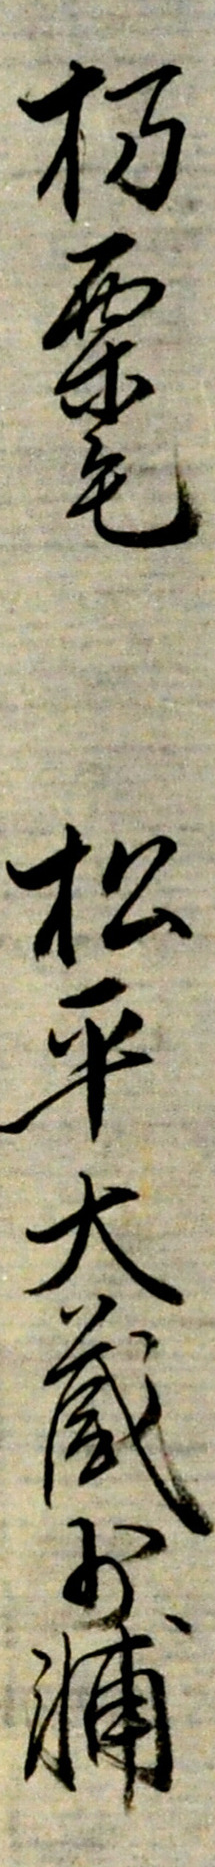栃栗毛松平大蔵少輔
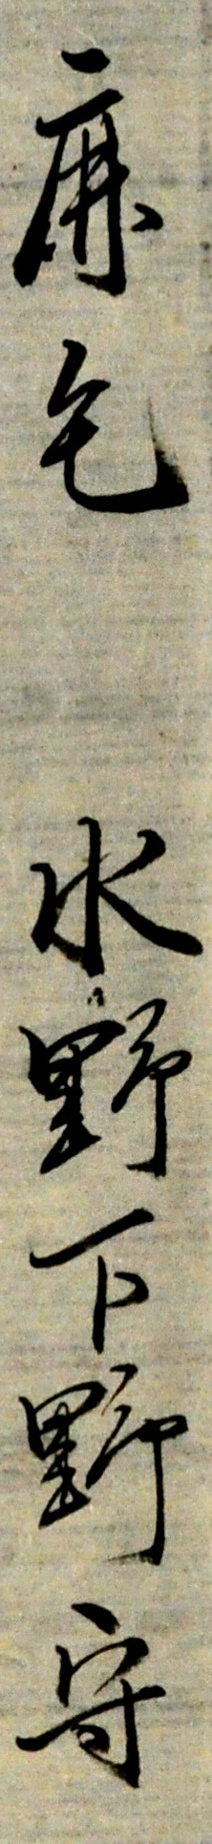鹿毛水野下野守
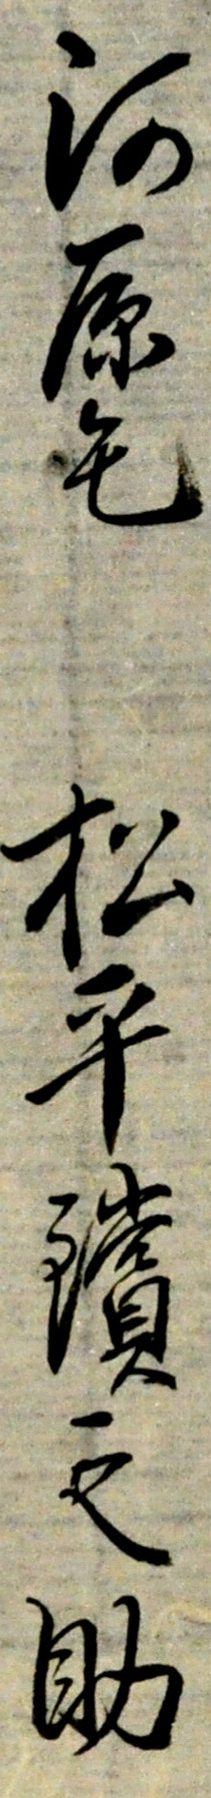河原毛松平鑜之助
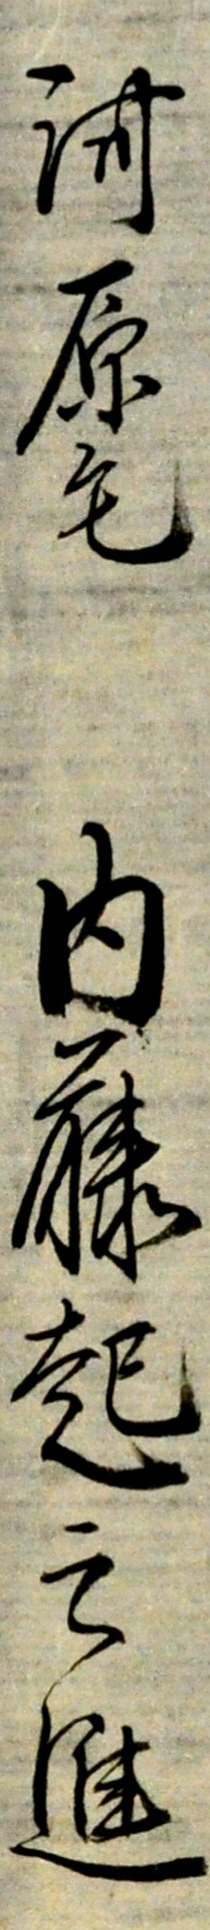河原毛内藤起之進
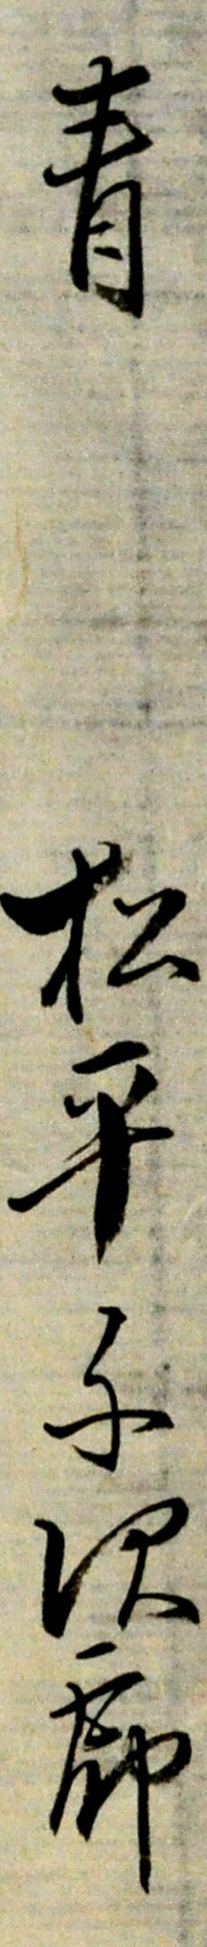青松平千次郎
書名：吹上御庭ニ於テ乗馬上覧ノ節留書外
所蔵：伊那市立高遠町図書館・合同会社AMANE
